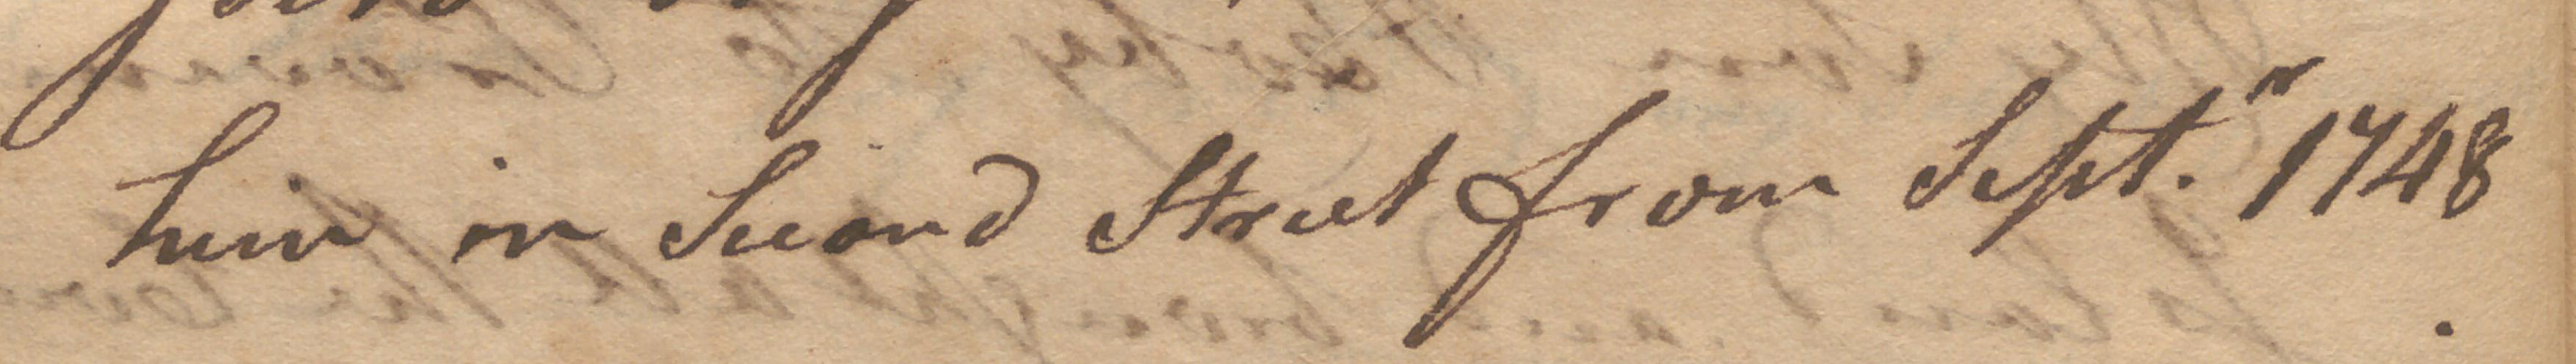him in Second Street from Sept^r. 1748
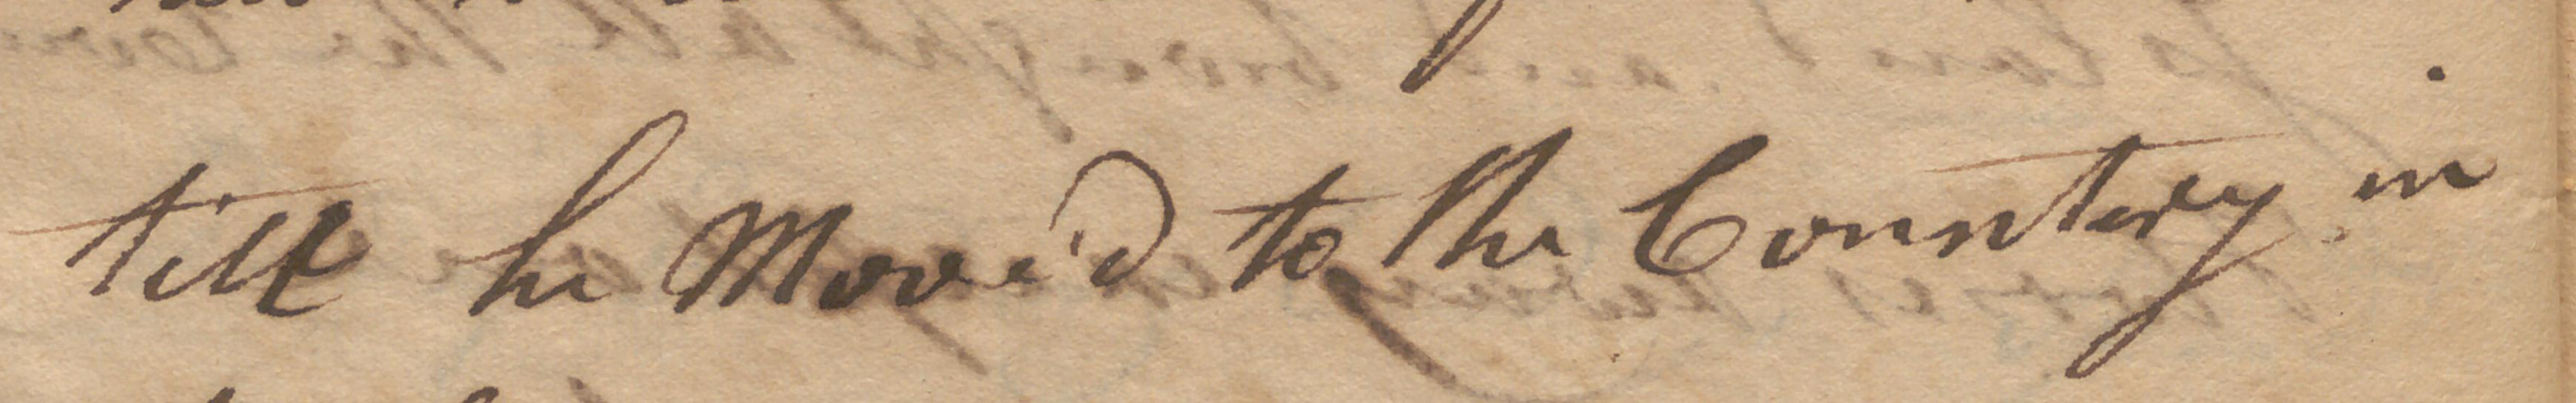till he move'd to the Country in
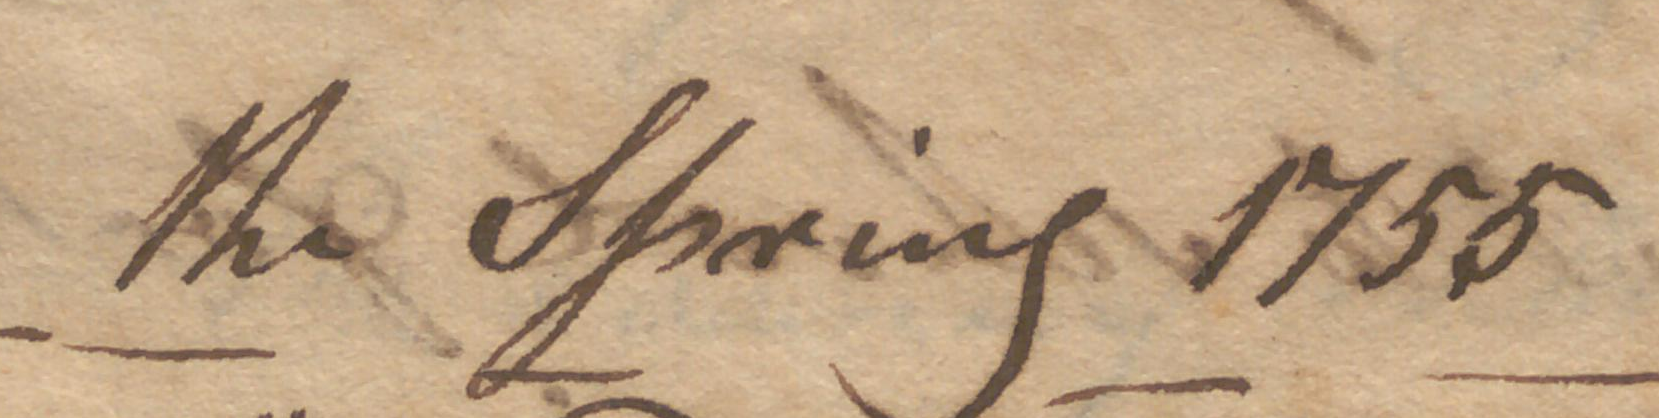the Spring 1755
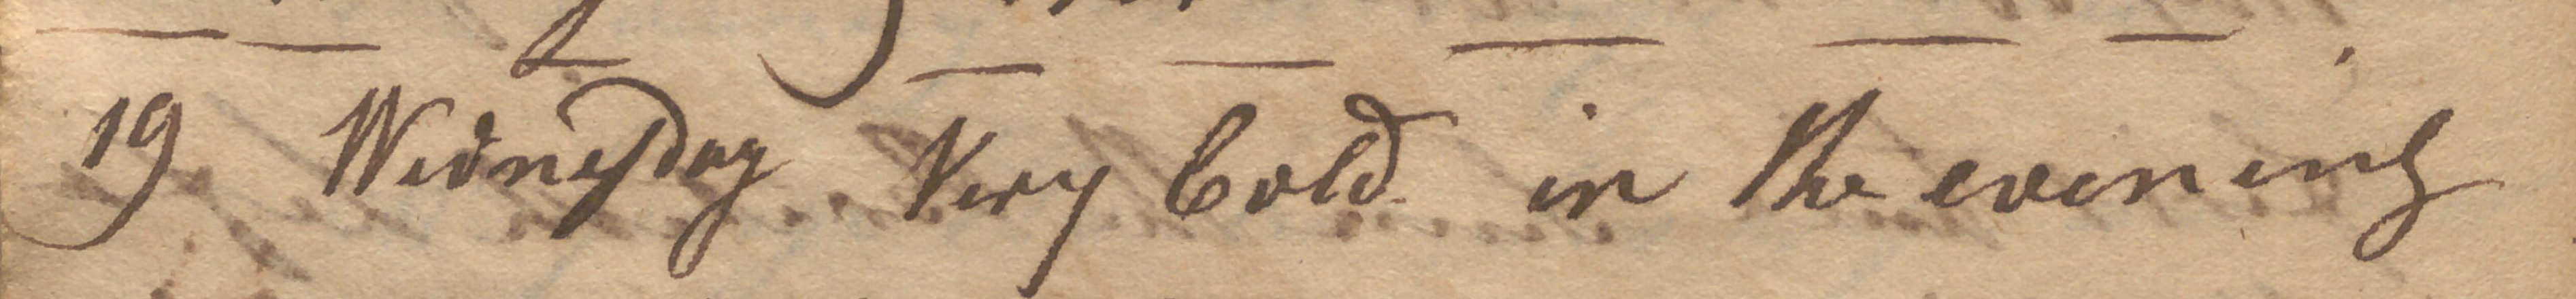1. Wednesday Very Cold in the evening
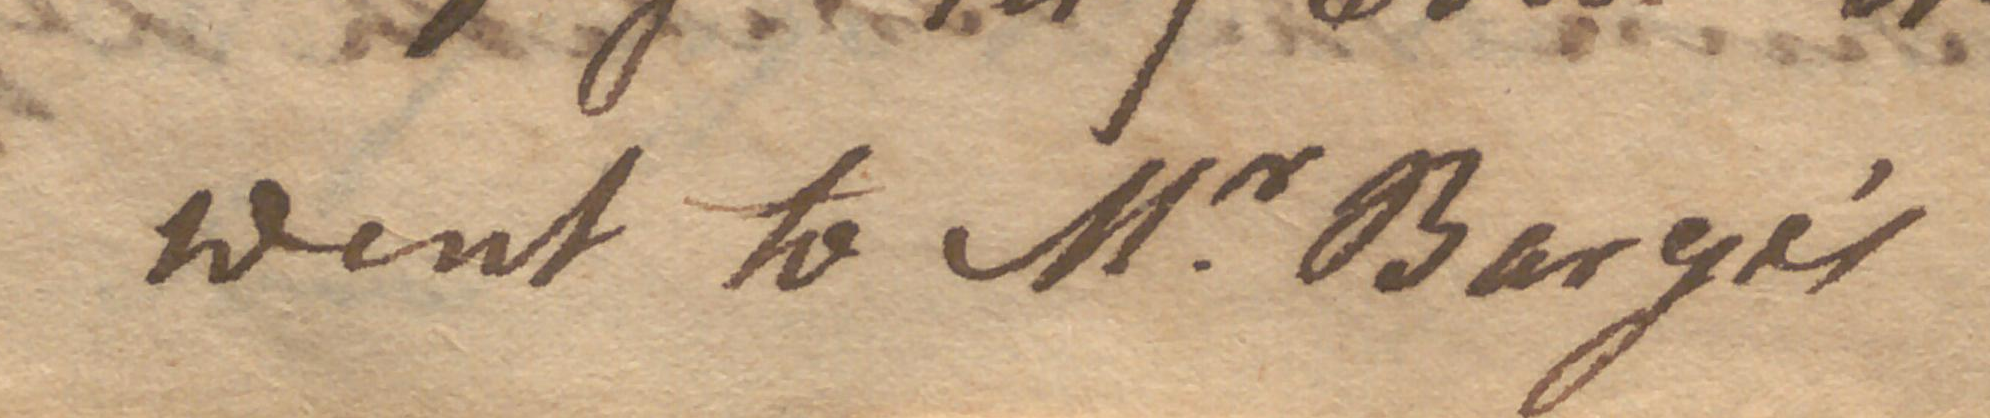went to M^r. Barge's
